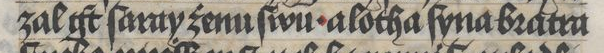zal ḡt ſaray żenu ſwu.a lotha ſyna bratra¬
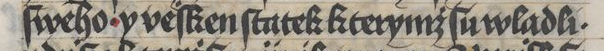ſweho. y veẛken ſtatek kterymiż ſu wladli.
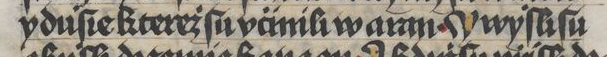y duẛie ktereżſu vċinili w aṙan.Y wyẛliſu
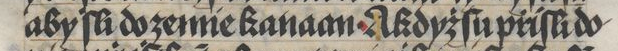aby ẛli do zemíe kanaan.A kdyż ſu pṙiẛli do¬
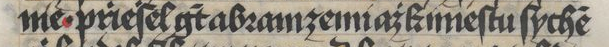nie.pṙieẛel ḡt abram zemi aż kmieſtu ſychē
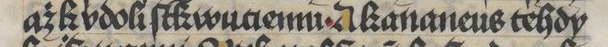aż k ydoli ſtkwuciemu.A kananeus tehdy
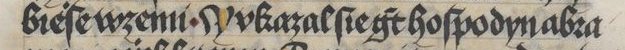bieẛe wzemi.Yvkazal ſie ḡt hoſpodyn abra¬
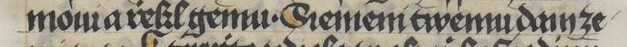moui a ṙekl gemu.Siemeni twemu dam ze¬
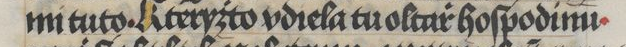mi tuto.Kteryżto vdiela tu oltař hoſpodinu.
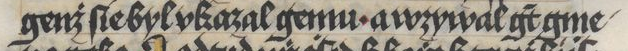genż ſie byl vkazal gemu.a wzywal ḡt gme¬
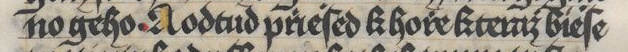no geho.A odtud pṙieẛed k hoṙe kteraż bíeẛe¬
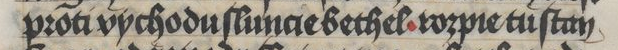proti vychodu ſluncie bethel.rozpie tu ſtan
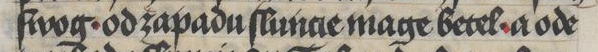ſwog.od zapadu ſluncie mage betel.a ode¬
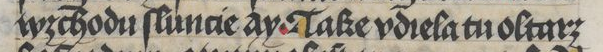wzchodu ſluncie ay.Take vdiela tu oltarz¬
